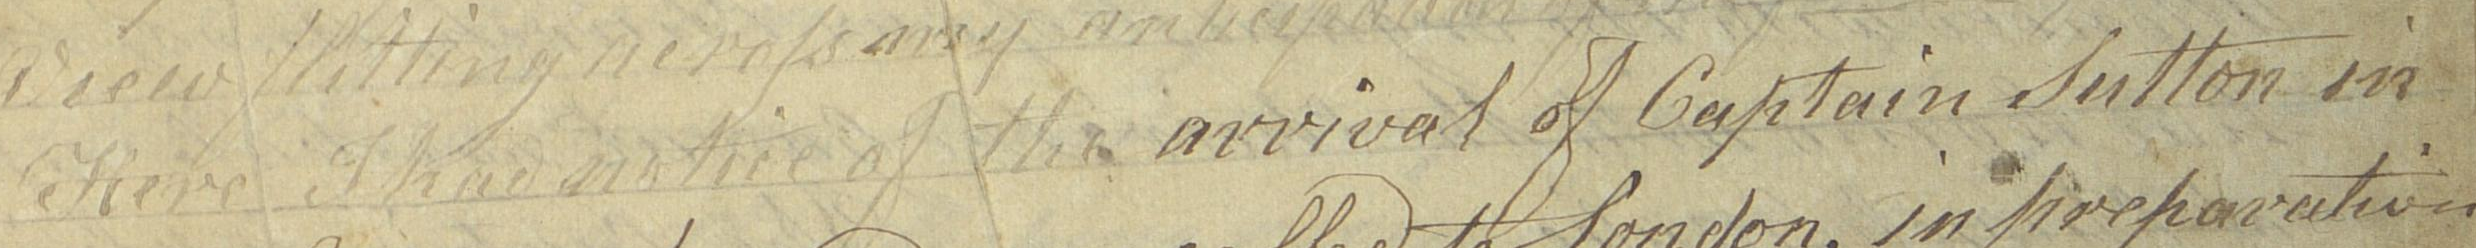There I had notice of the arrival of Captain Sutton in
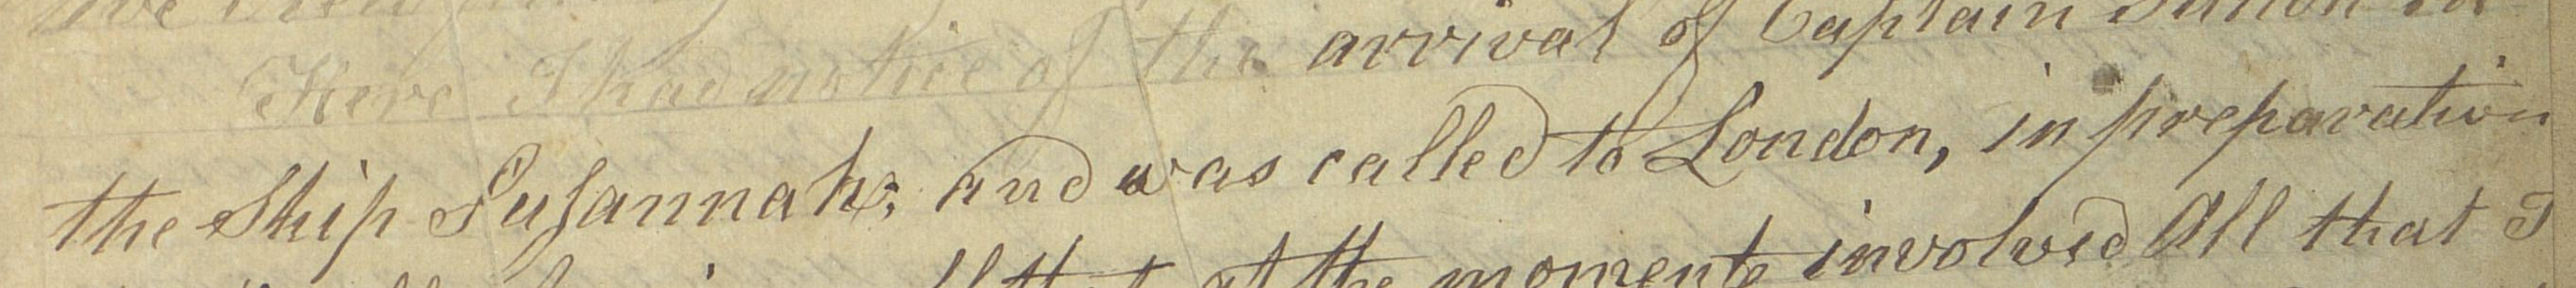the Ship Susannah; and was called to London, in preparation
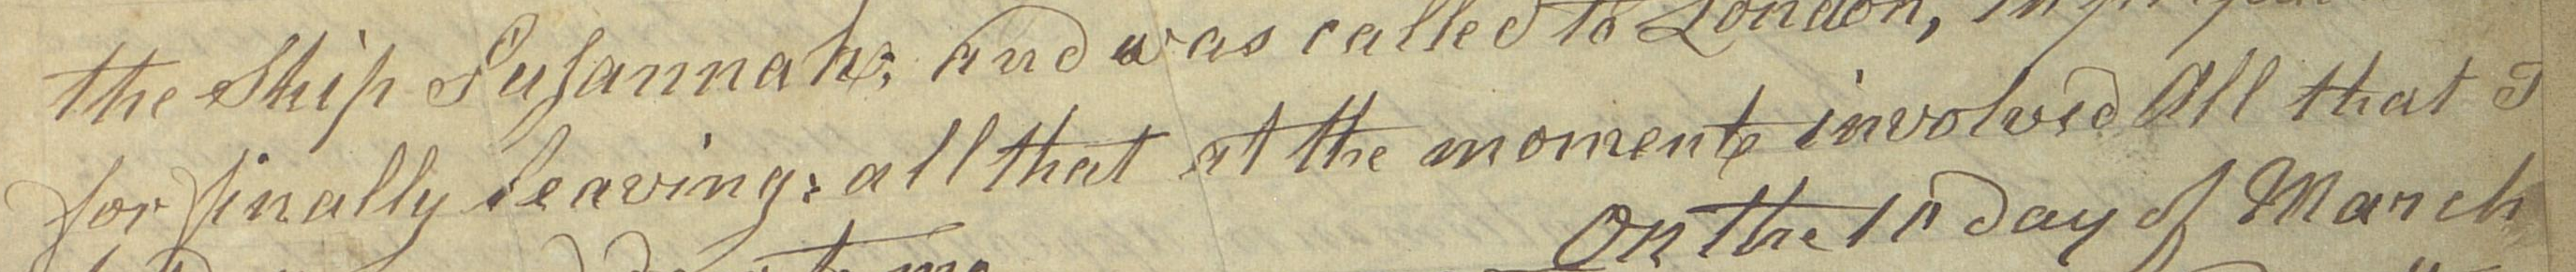for finally leaving all that at the moment involved All that I
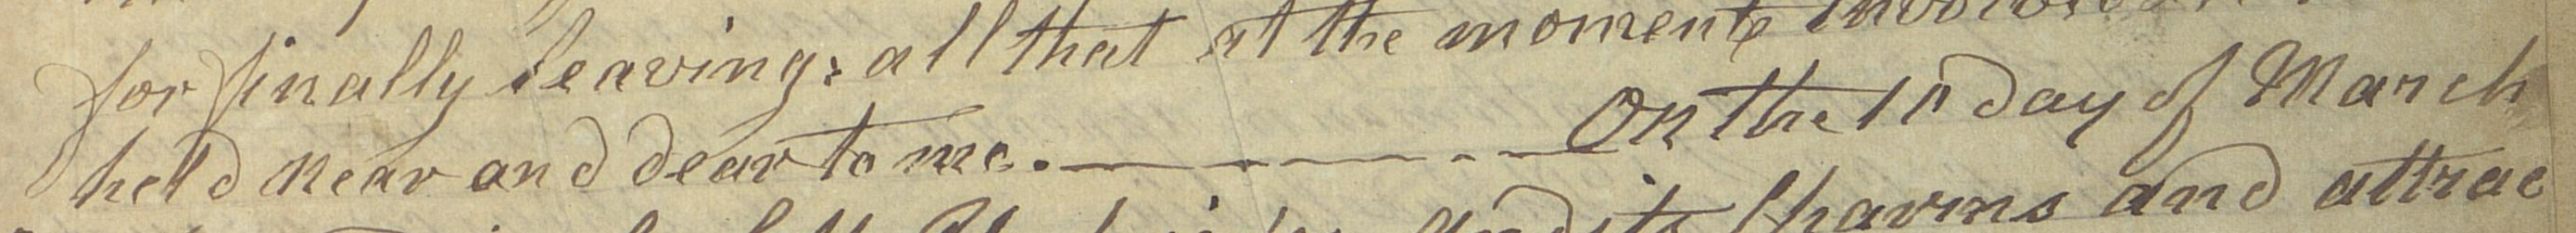held near and dear to me. On the 11 day of March
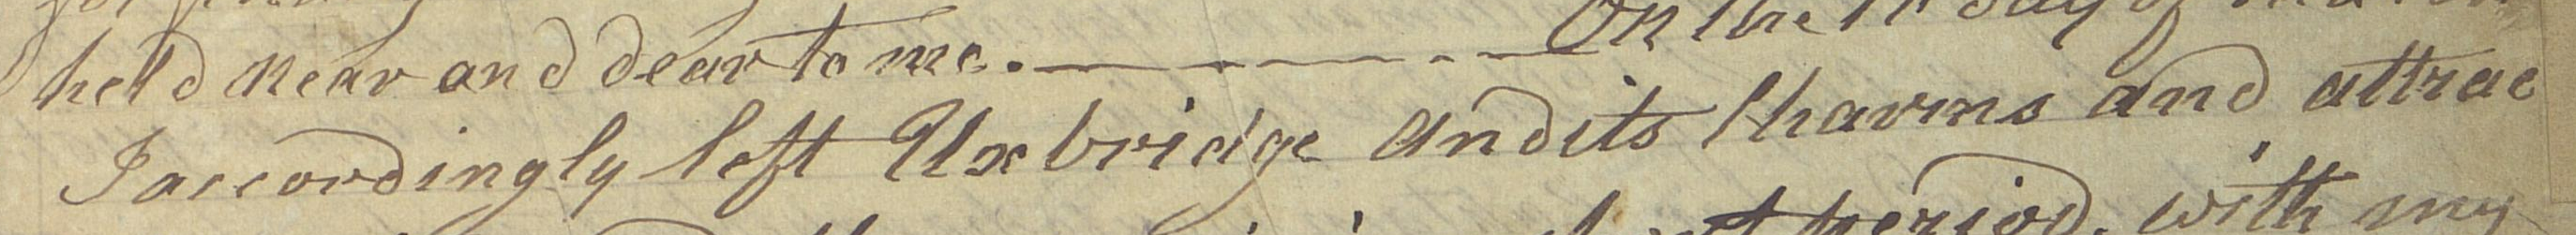I accordingly left Uxbridge and its Shavins and attrac-
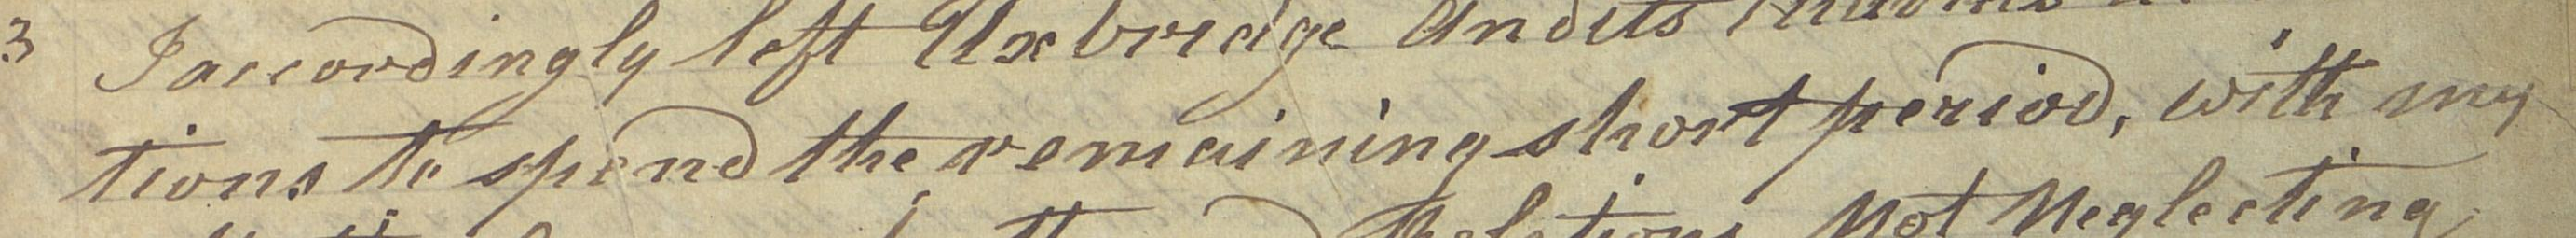-tions to spend the remaining short period, with my
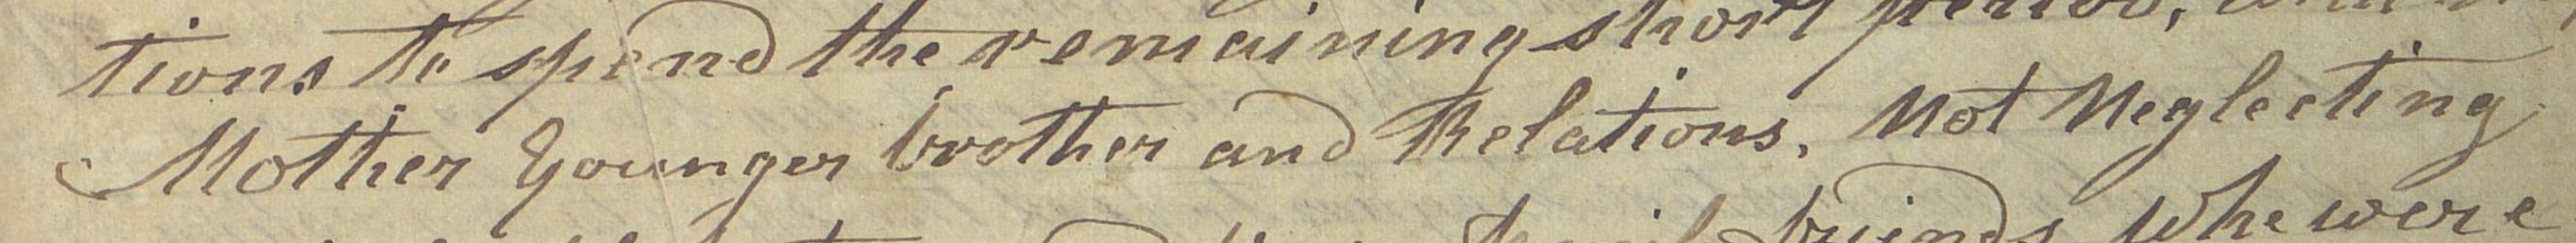Mother Younger brother and Relations. Not Neglecting
